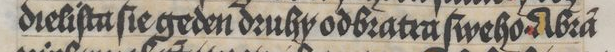dieliẛta ſie geden druhy odbratra ſweho.Abrā
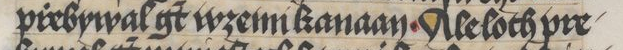pṙebywal ḡt wzemi kanaan.Ale loth pṙe¬
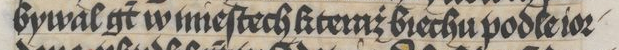bywal ḡt w mieſtech kteraż biechu podle ior¬
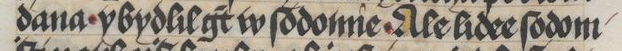dana.ybydlil ḡt w ſodomie.Ale lidee ſodom¬
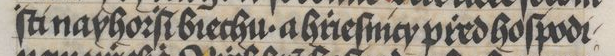ẛtí nayhorẛí biechu.a hṙieſnícy pṙed hoſpodi¬
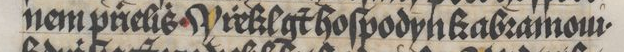nem pṙíeliš.Y ṙekl ḡt hoſpodyn kabramoui.
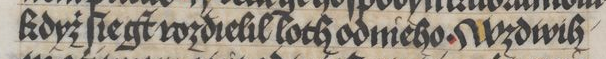kdyż ſie ḡt rozdielil loth odnieho.Wzdwih¬
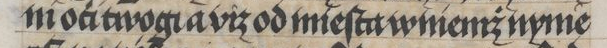ni oċi twogi a viz od míeſta wníemż nynie
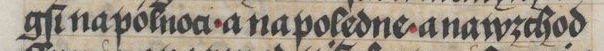gſi na pólnoci.a na poledne.a na wzchod
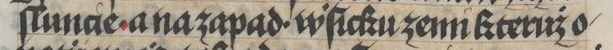ſluncie.a na zapad.wẛicku zemi kteruż o¬
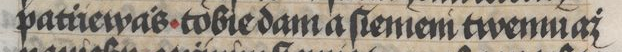patṙiewaṡ.tobie dam a ſiemeni twemu aż
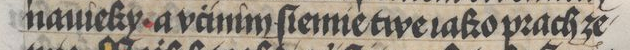navieky.a vċinim ſiemie twe iako prach ze¬
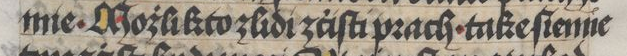mie.Możli kto zlidi zċiſti prach.take ſiemie
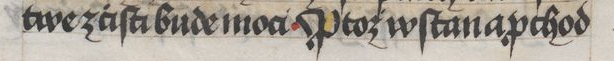twe zċiſti bude moci.Ꝓtoż wſtan a ꝓchod
